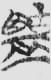○（盬）
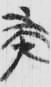○（族）
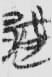○（域）
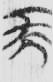夫一
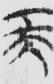一夫
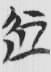凥
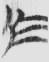於
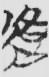○（路）
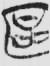區
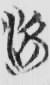○（淵）
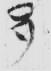邑
